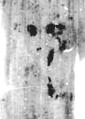乙
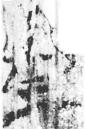星
